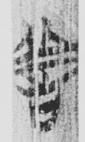善
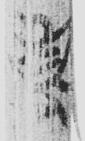事
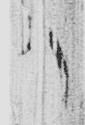人
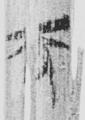而
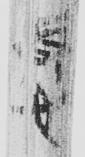○（憂）
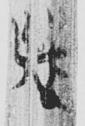○（者）
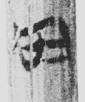含（今）
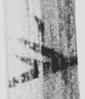之
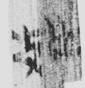殜（世）
